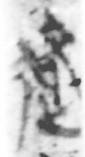○（路）
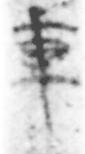車
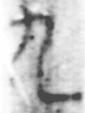九
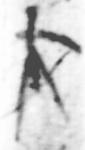大
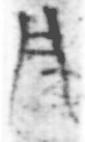凡
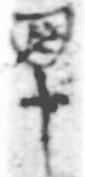四十
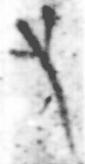又
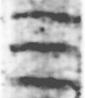三
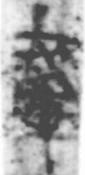𨍱（乘）
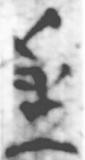至
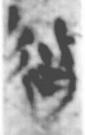紫（此）
